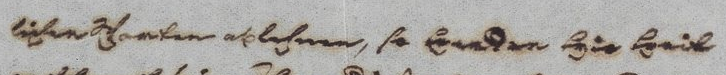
lichen Worten ablehnen, so werden wir weit
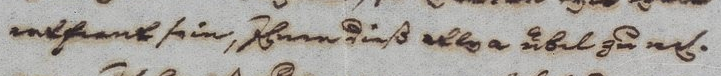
entfernt sein, Ihnen dieß etwa übel zu neh-
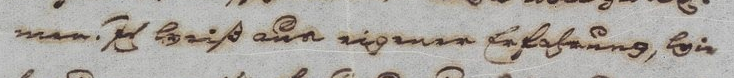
men. Ich weiß aus eigener Erfahrung, wie
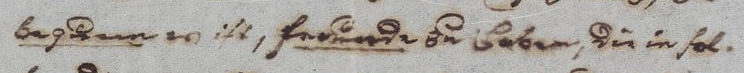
bequem es ist, Freunde zu haben, die in sol-
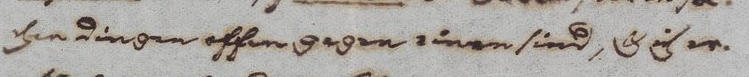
chen Dingen offen gegen einen sind, & ich er-
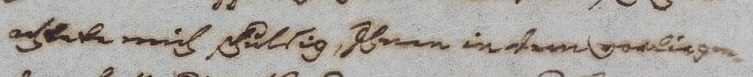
achtete mich schuldig, Ihnen in dem vorliegen-
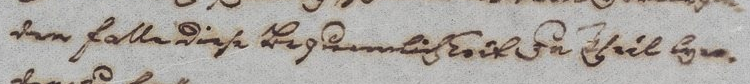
den Falle diese Bequemlichkeit zu Theil wer-
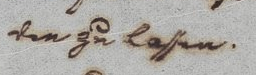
den zu lassen.
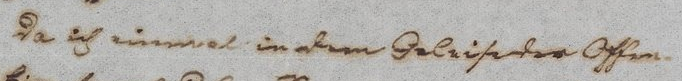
Da ich einmal in dem Geleise der Offen-
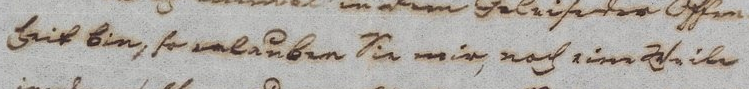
heit bin, so erlauben Sie mir, noch eine Weile
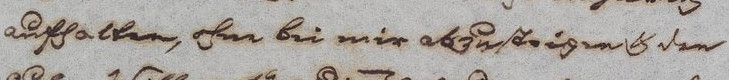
aufhalten, ohne bei mir abzusteigen & den
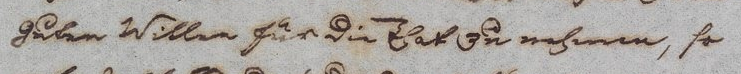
guten Willen für die That zu nehmen, so
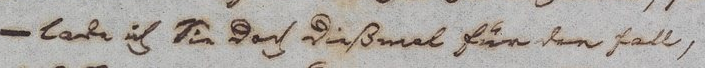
– lade ich Sie doch dießmal für den Fall,
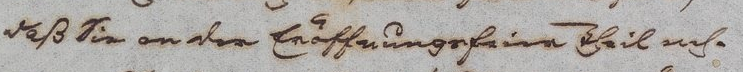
daß Sie an der Eröffnungsfeier Theil neh-
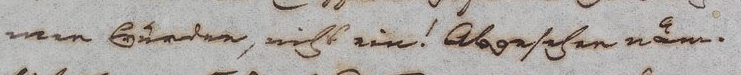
men würden, nicht ein! Abgesehen näm-
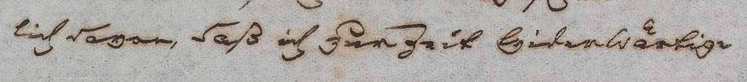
lich davon, daß ich zur Zeit widerwärtige
